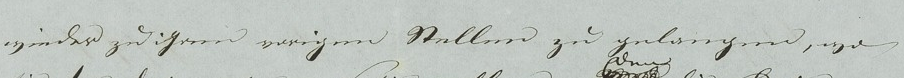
wieder zu ihren vorigen Stellen zu gelangen, wo
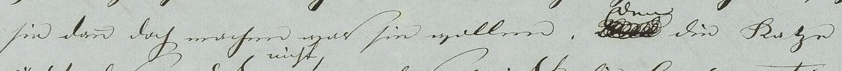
sie dann doch machen was sie wollen. ...Den die Katze
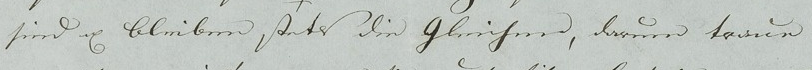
sind & bleiben stets die Gleichen, darum traue
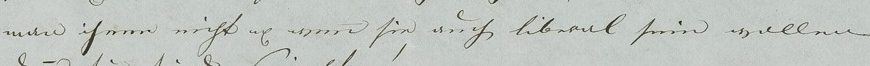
man ihnen nicht & wenn sie auch liberal sein wollen,
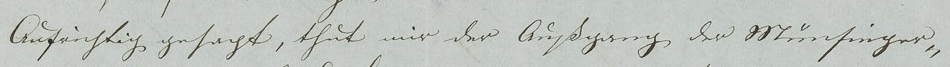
Aufrichtig gesagt, thut mir der Außgang der Münsinger-
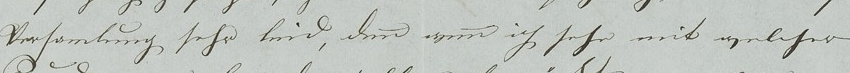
Versamlung sehr leid, denn wenn ich sehe mit welcher
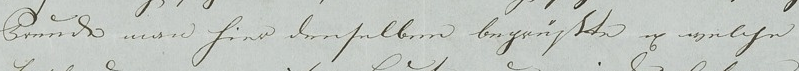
Freude man hier denselben begrüßte & welche
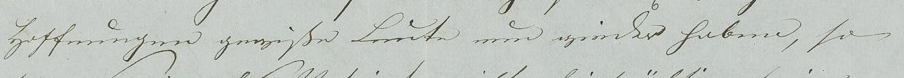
Hoffnungen gewiße Leute nun wieder haben, so
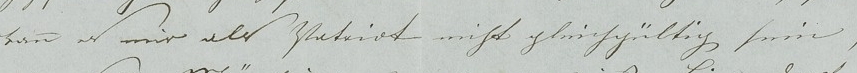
kann es mir als Patriot nicht gleichgültig sein,
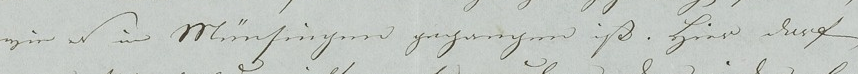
wie es in Münsingen gegangen ist. Hier darf
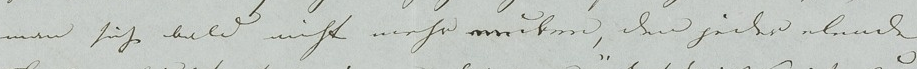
man sich bald nicht mehr muken, den jeder elende
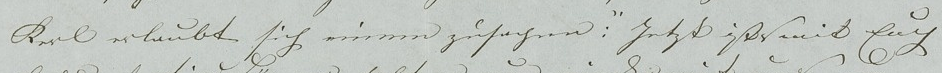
Kerl erlaubt sich einem zusagen: «Jetzt ists mit Euch
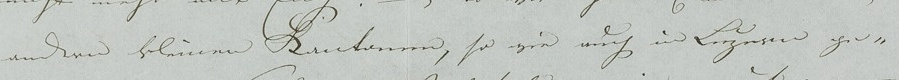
andern kleinen Kantonen, so wie auch in Luzern ge-
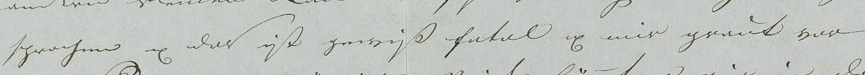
sprochen & das ist gewiß fatal & mir graut vor
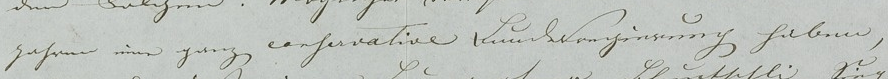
Jahren eine ganz conservative Bundesregierung haben,
